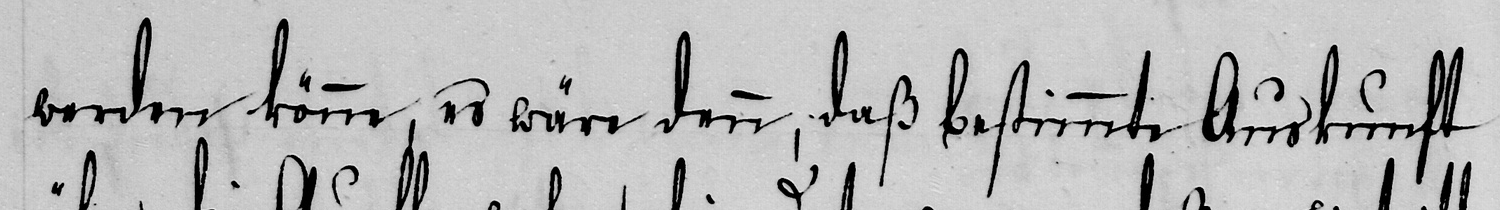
werden könne, es wäre denn, daß bestimmte Auskunft
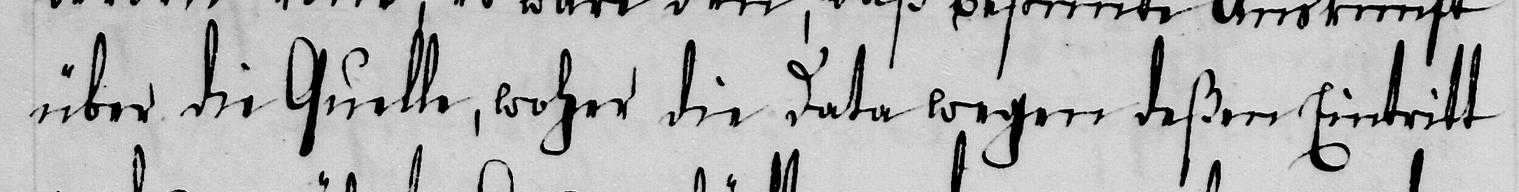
über die Quelle, woher die Data wegen deßen Eintritt
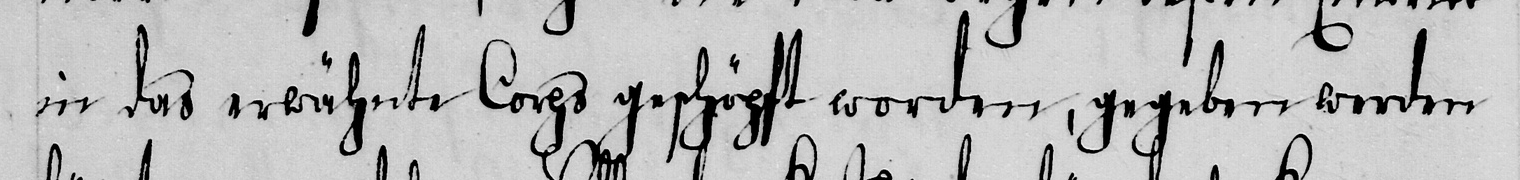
in das erwähnte Corps geschöpft worden, gegeben werden
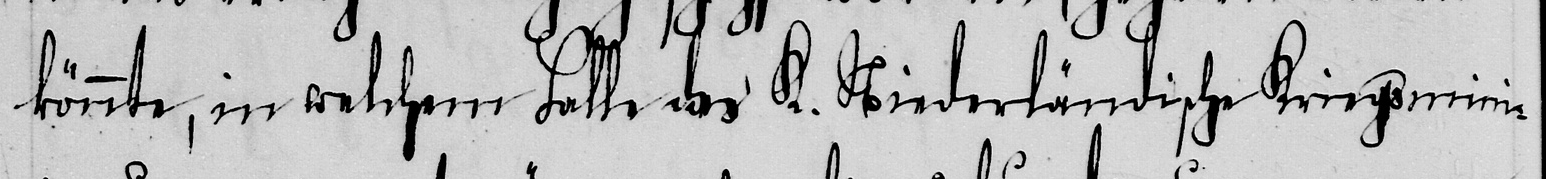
könnte, in welchem Falle das K. Niederländische Kriegsmini¬
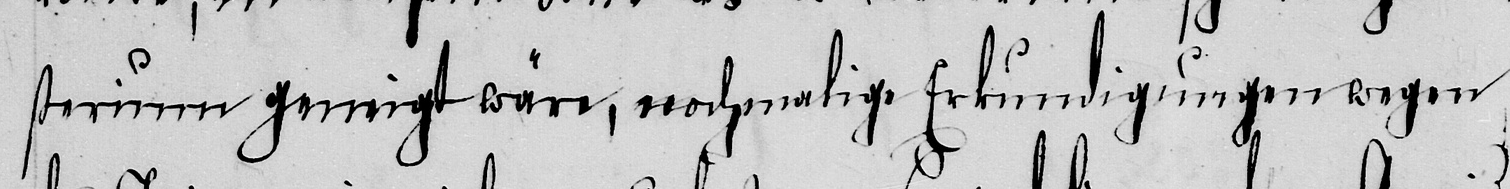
sterium geneigt wäre, nochmalige Erkundigungen wegen
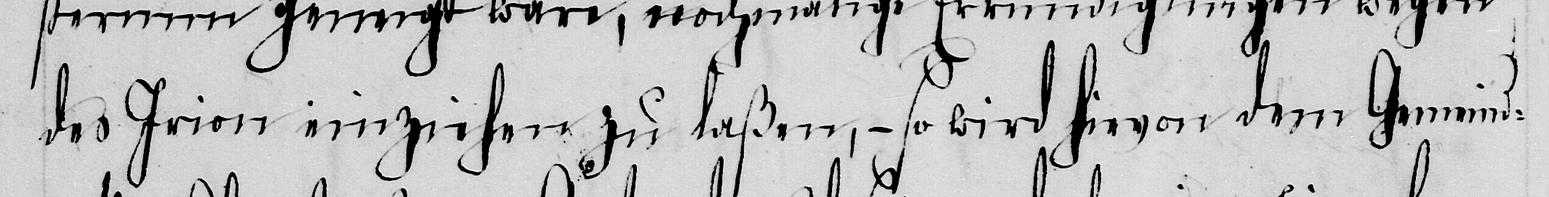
des Irion einziehen zu laßen, – so wird hievon dem Gemeind¬
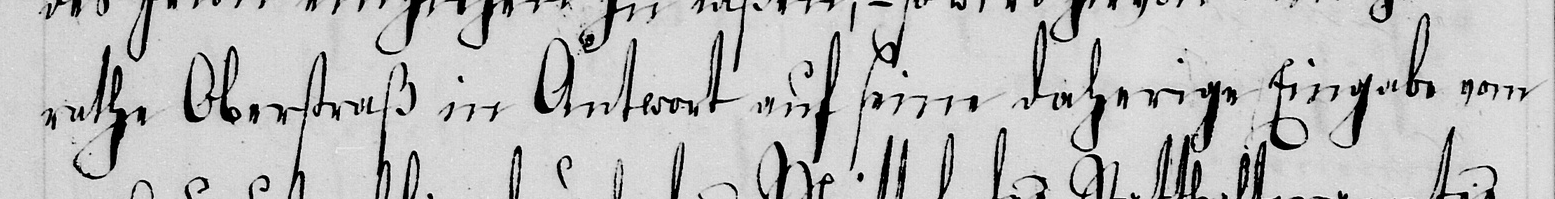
rathe Oberstraß in Antwort auf seine daherige Eingabe vom
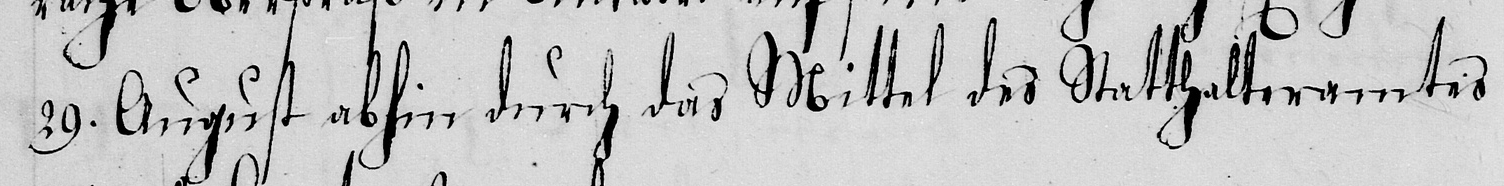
29. August abhin durch das Mittel des Statthalteramtes
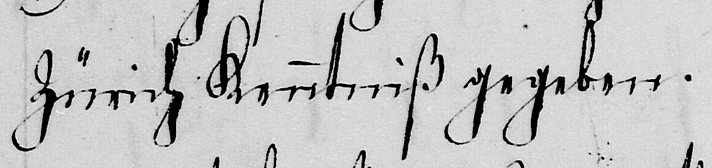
Zürich Kenntniß gegeben.
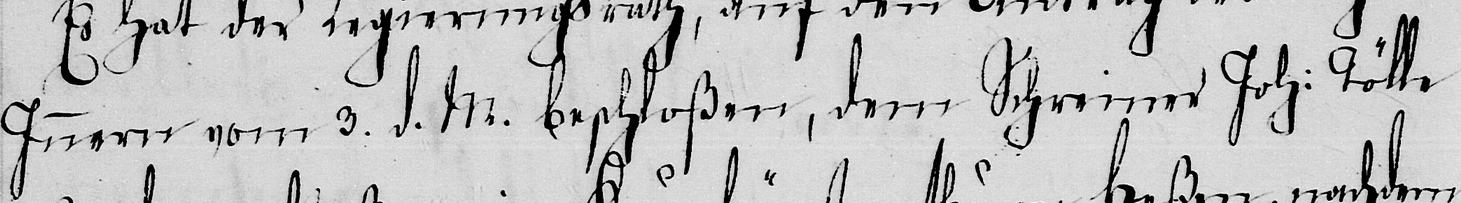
Innern vom 3. d. M. beschloßen, dem Schreiner Joh. Tölle
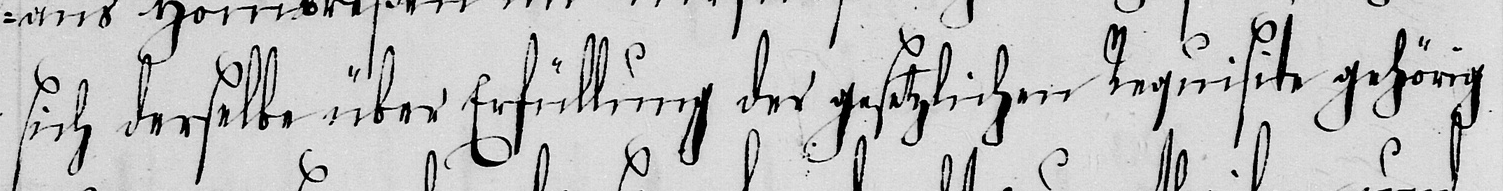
sich derselbe über Erfüllung der gesetzlichen Requisite gehörig
